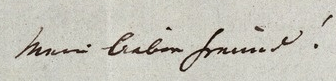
Mein lieber Freund!
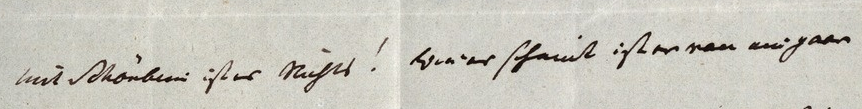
Mit Schönbein ist es Nichts! Wie es scheint ist er von einigen
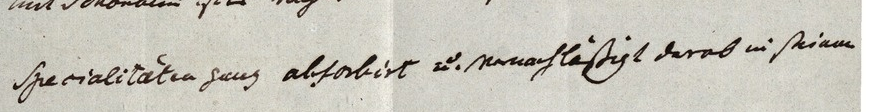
Specialitäten ganz absorbirt u. vernachläßigt darob in seinen
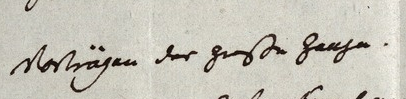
Vorträgen das große Ganze.
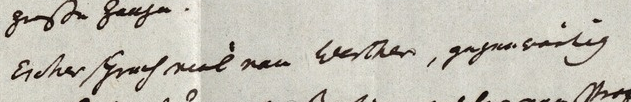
Escher sprach viel von Werther, gegenwärtig
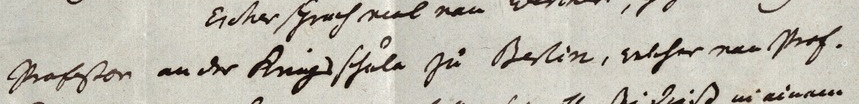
Profeßor an der Kriegsschule zu Berlin, welcher von Prof.
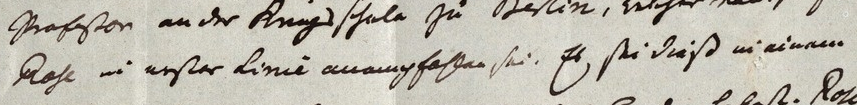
Rose in erster Linie anempfohlen sei. Es sei dieß in einem
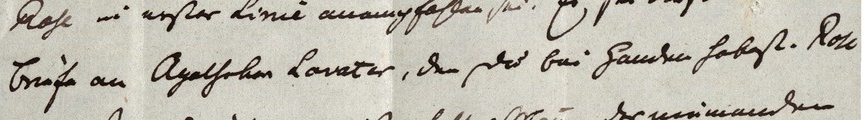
Briefe an Apotheker Lavater, den Du bei Handen habest. Rose
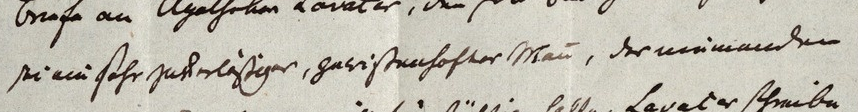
sei ein sehr zuverläßiger, gewißenhafter Mann, der niemanden
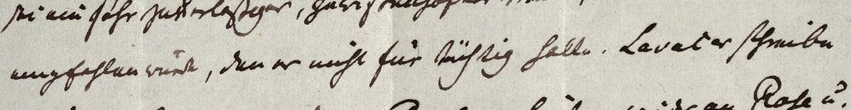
empfehlen würde, den er nicht für tüchtig halte. Lavater schreibe
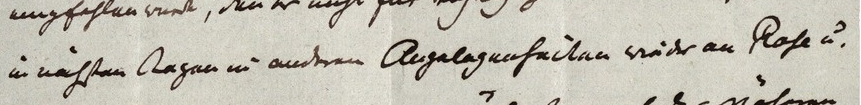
in nächsten Tagen in andren Angelegenheiten wieder an Rose u.
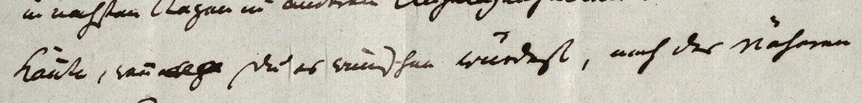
könnte, wenn ... Du es wünschen würdest, noch des Näheren
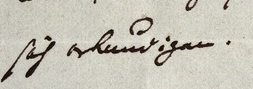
sich erkundigen.
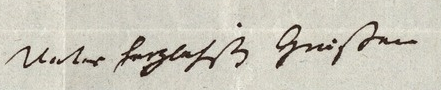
Unter herzlichsten Grüßen
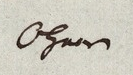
O Heer
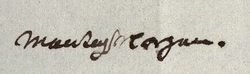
Montags Morgen.
